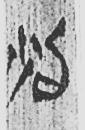{少勺}
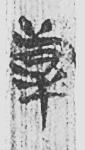倝
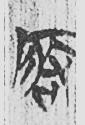啟
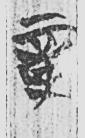章
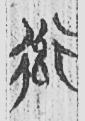率
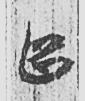𠂤
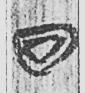回
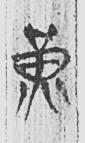黃
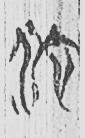池
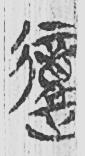{辶童}
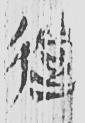迵
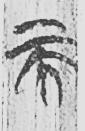而
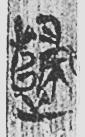歸
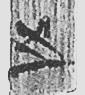之
